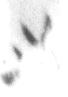之
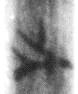之
